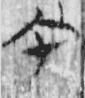午
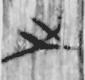之
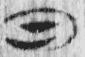日
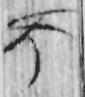不
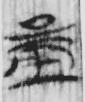量
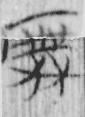廡
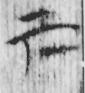下
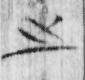之
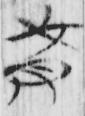貸
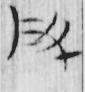阩
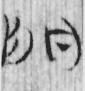門
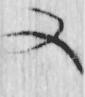又
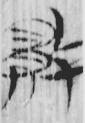敗
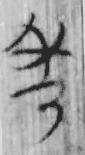秀
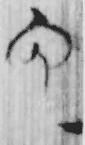免
